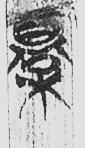{日棗}
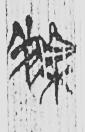殜
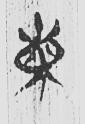柬
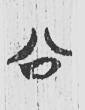公
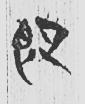即
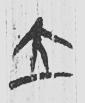立
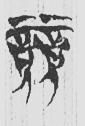競
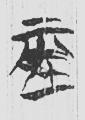坪
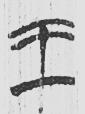王
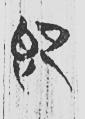即
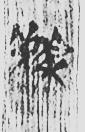殜
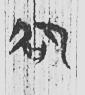卲
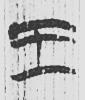王
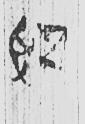即
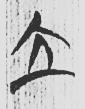立
